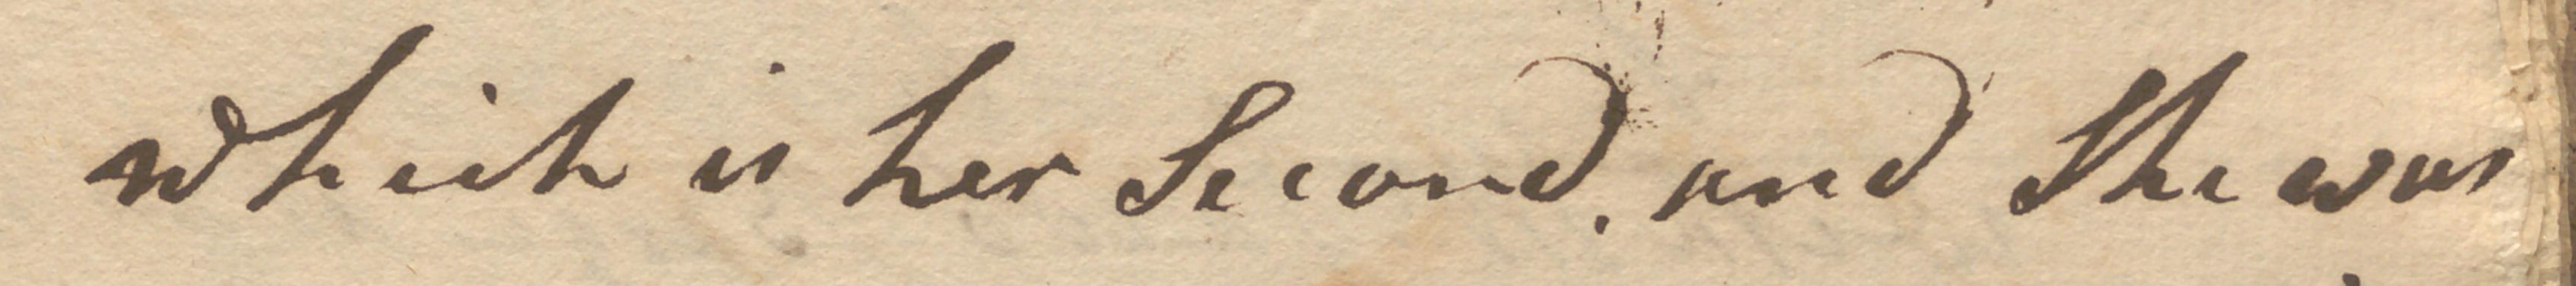which is her second, and She was
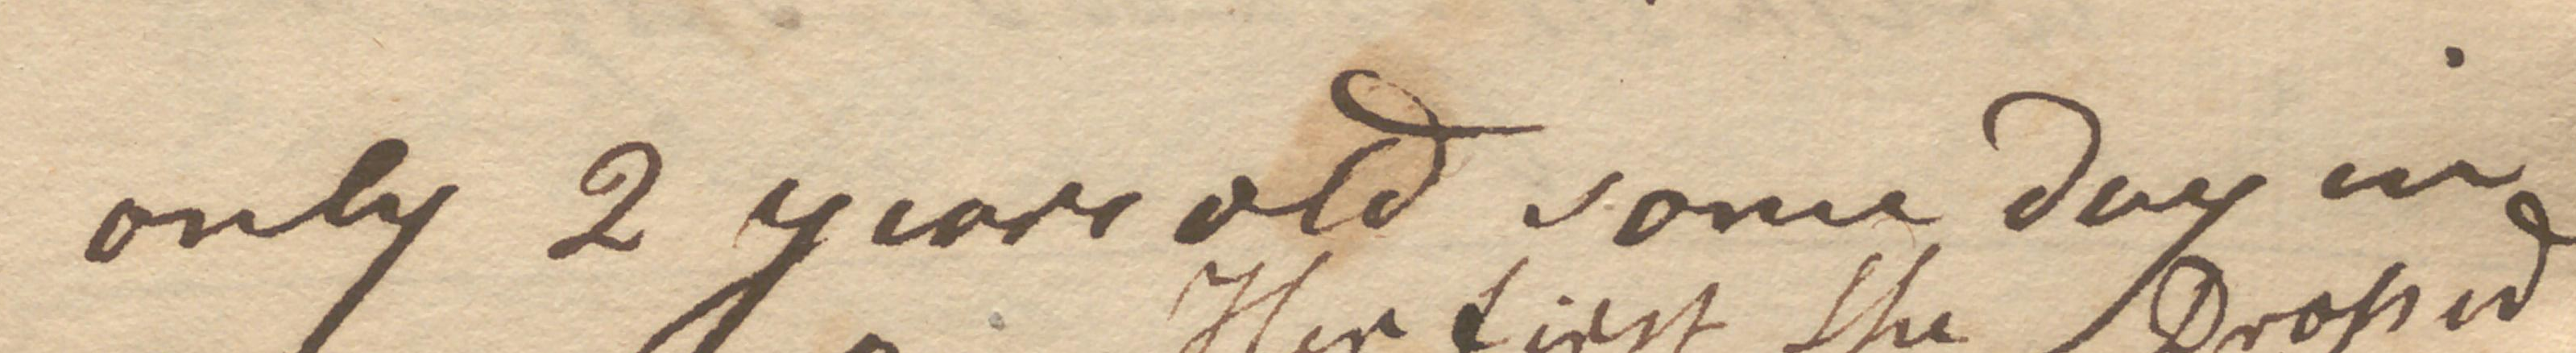only 2 years old some day in
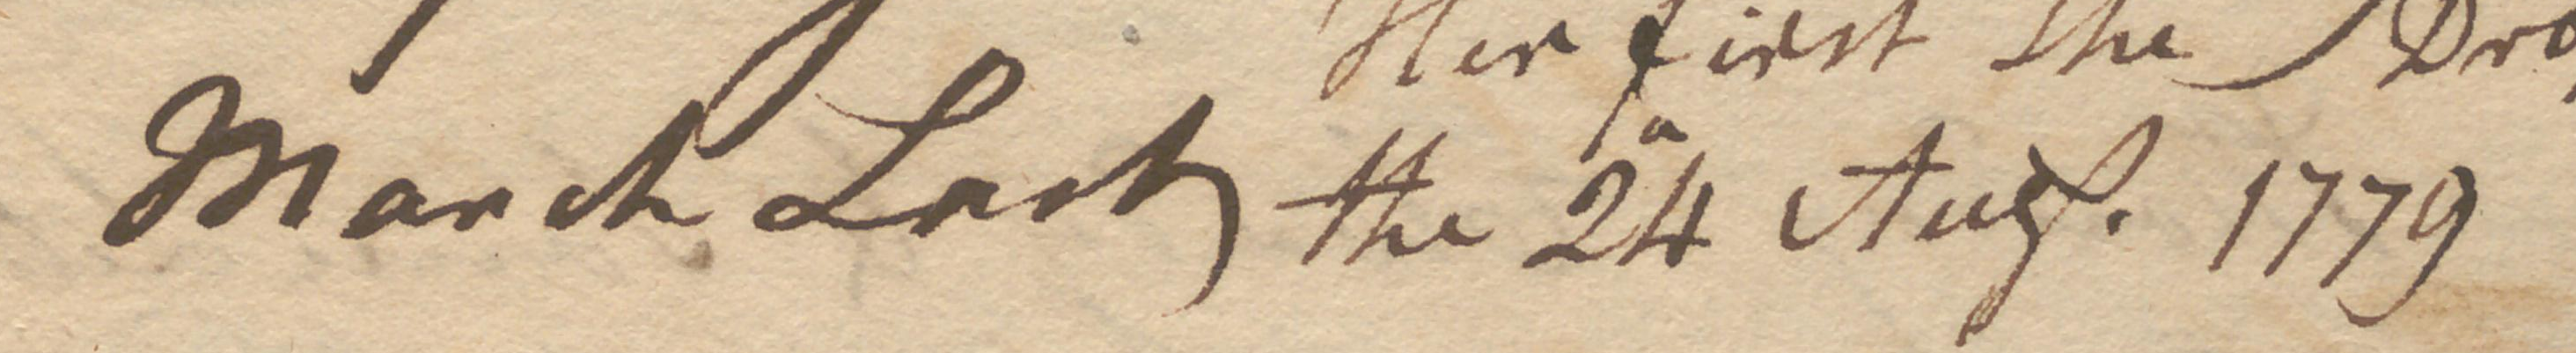March Last the 24 Aug^t. 1779
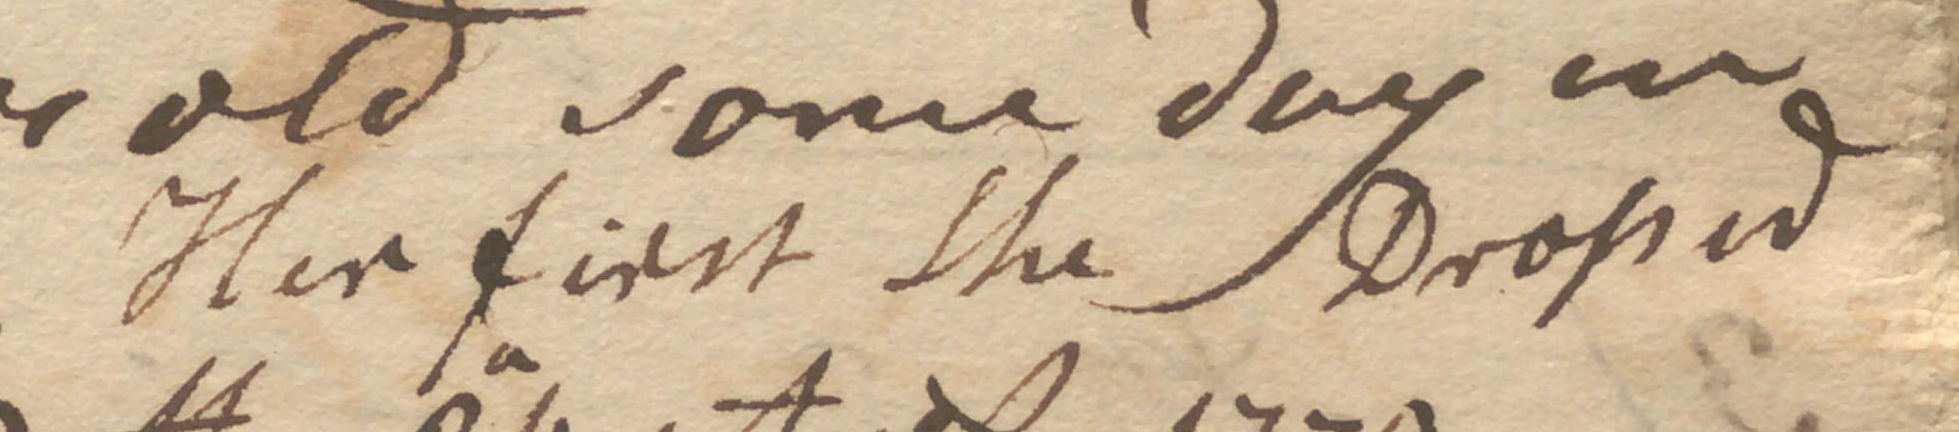Her first She Droped
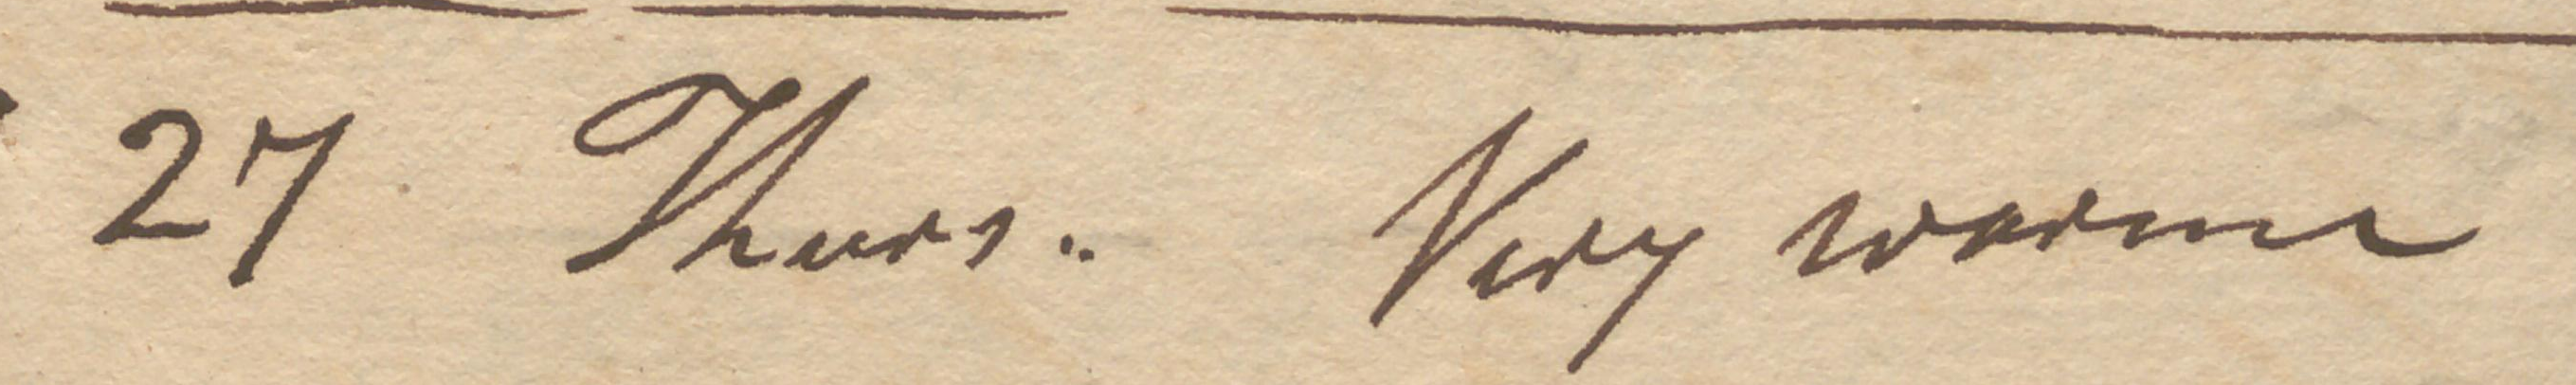27 Thurs. Very warme
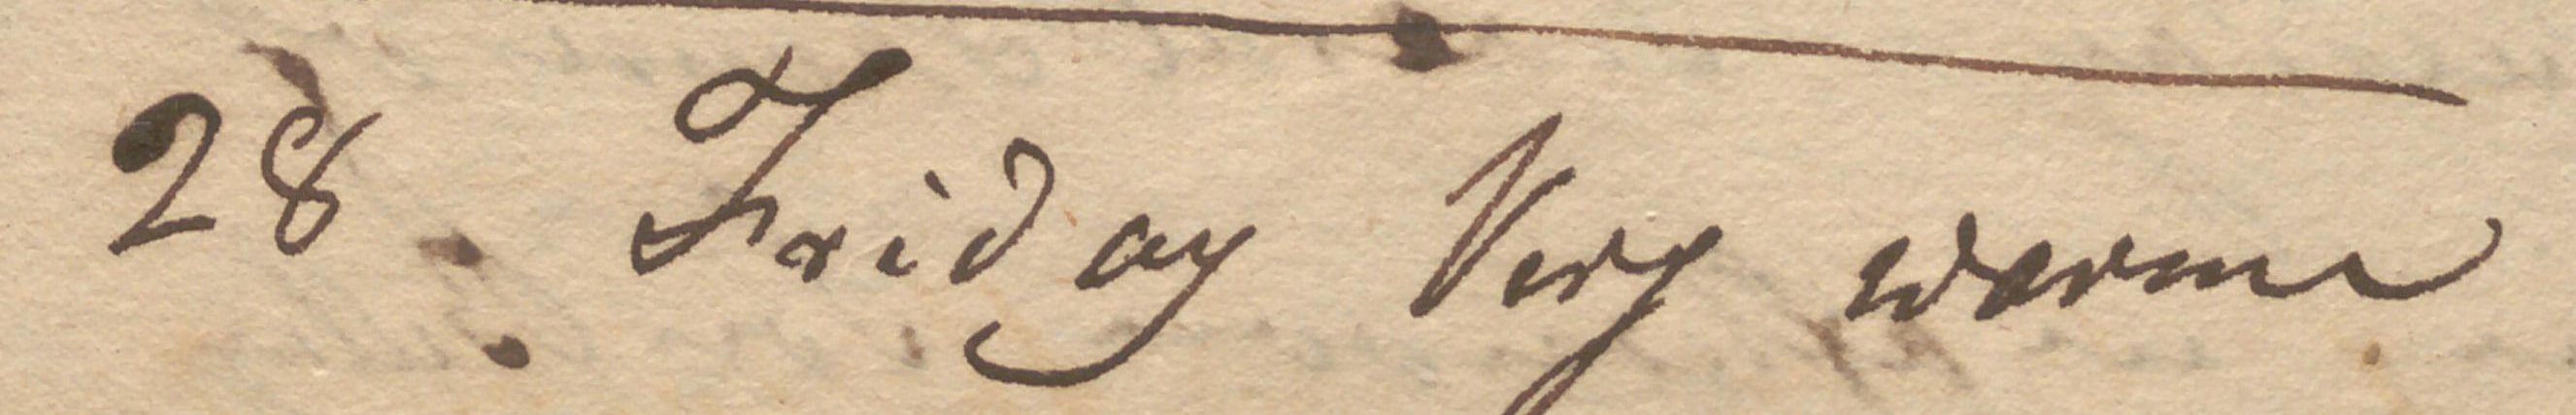28 Friday Very warme
